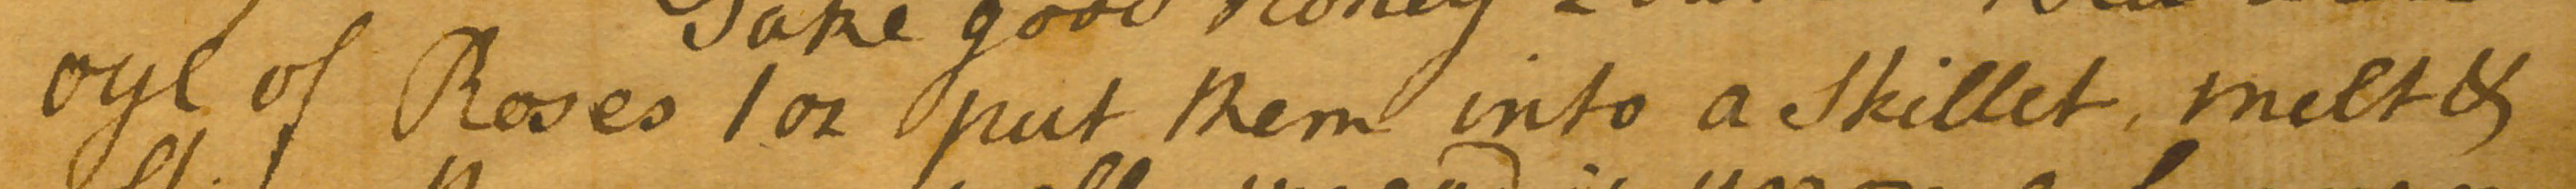oyl of Roses 1 oz put them into a skillet, melt &
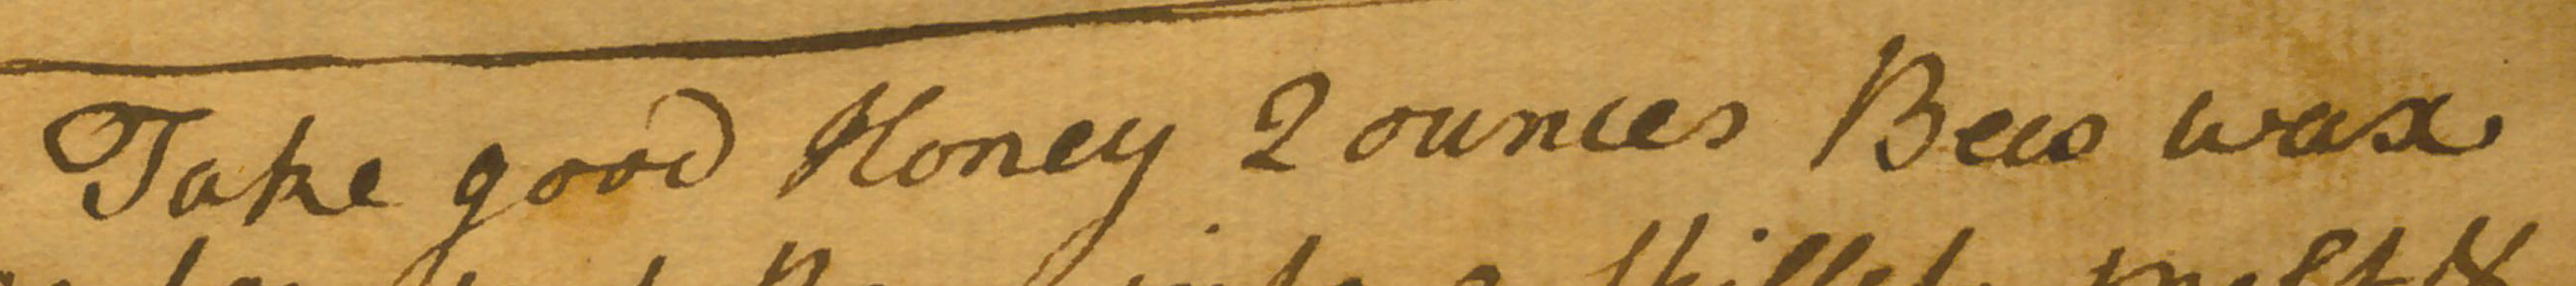Take good Honey 2 ounces Bees wax
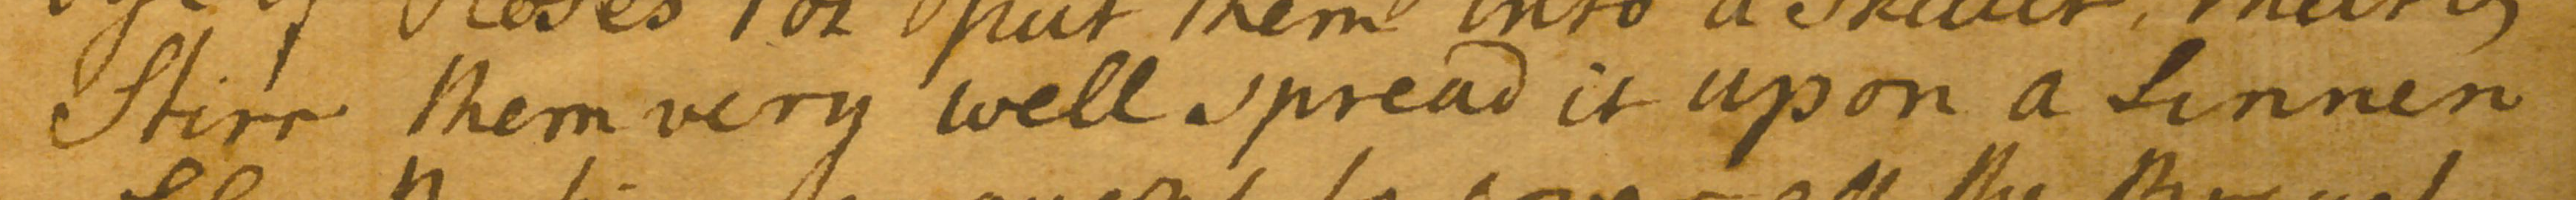stirr them very well spread it upon a Linnen
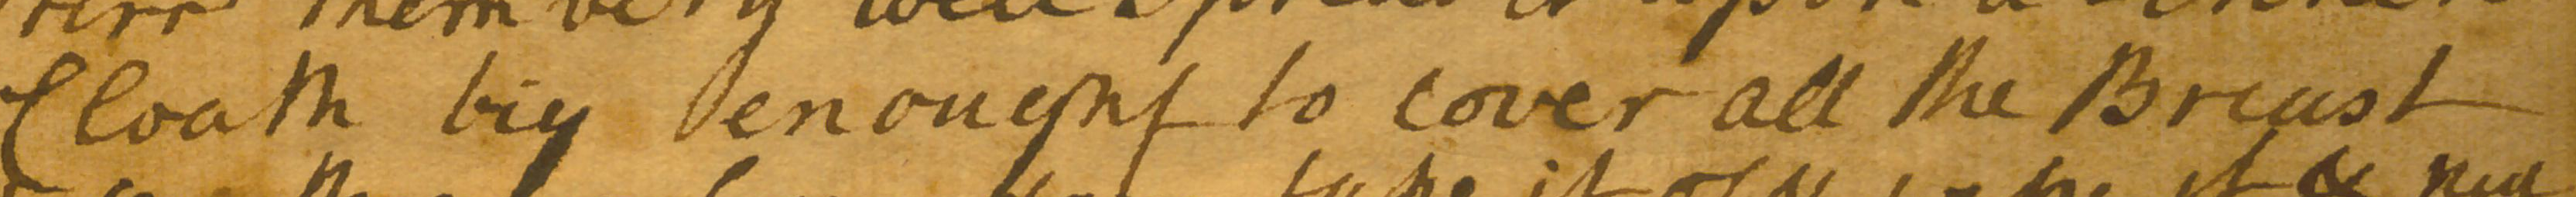Cloath by enough to cover all the Breast
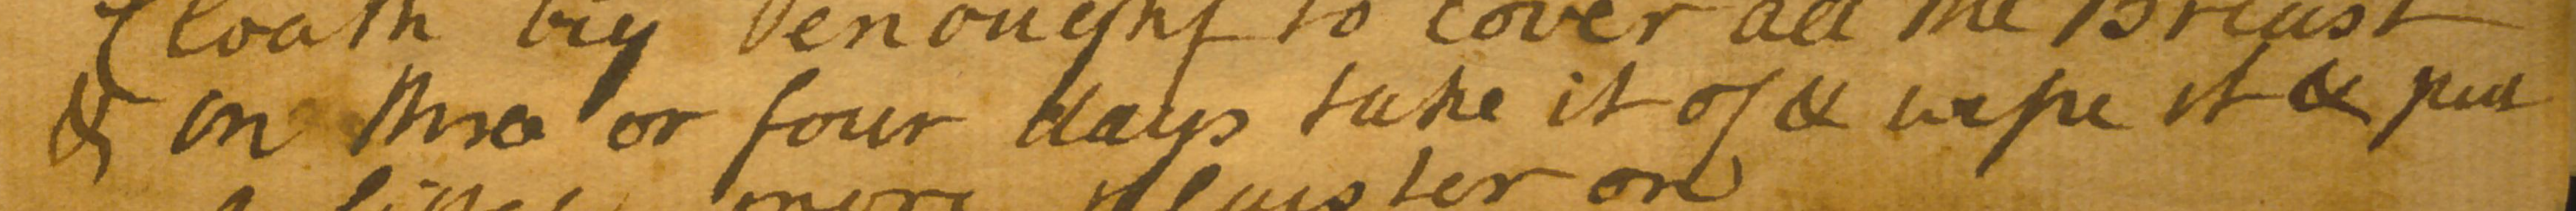& on two or four days take it of & wipe it & put
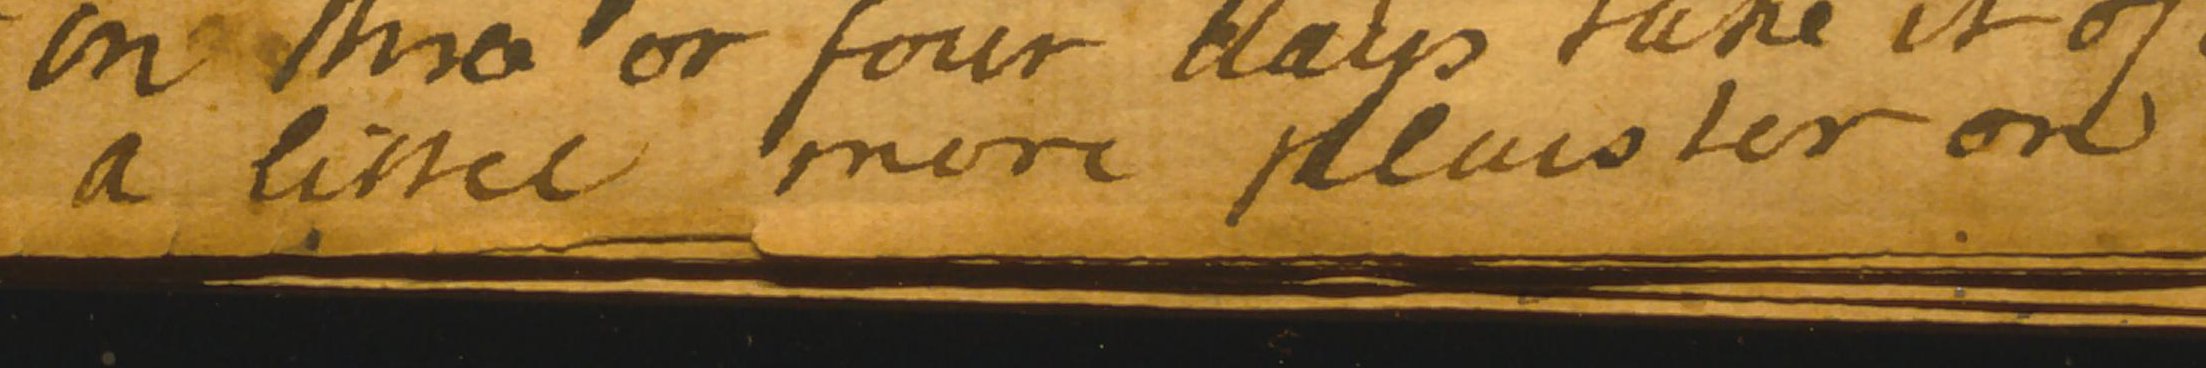a little more plaister on
